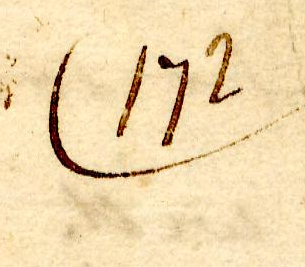(172
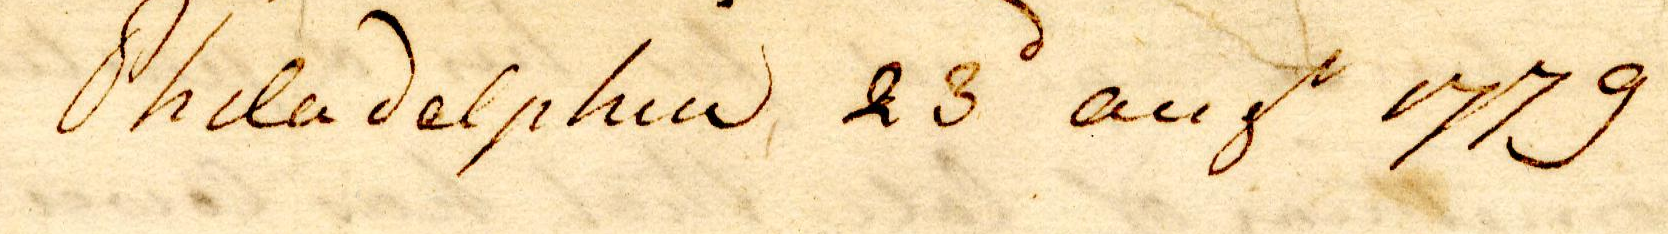Philadelphia 23^d aug^t 1779
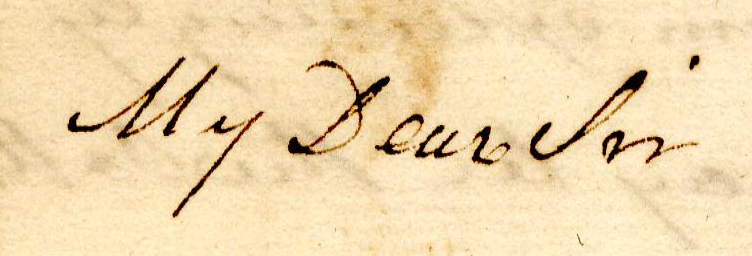My Dear Sir
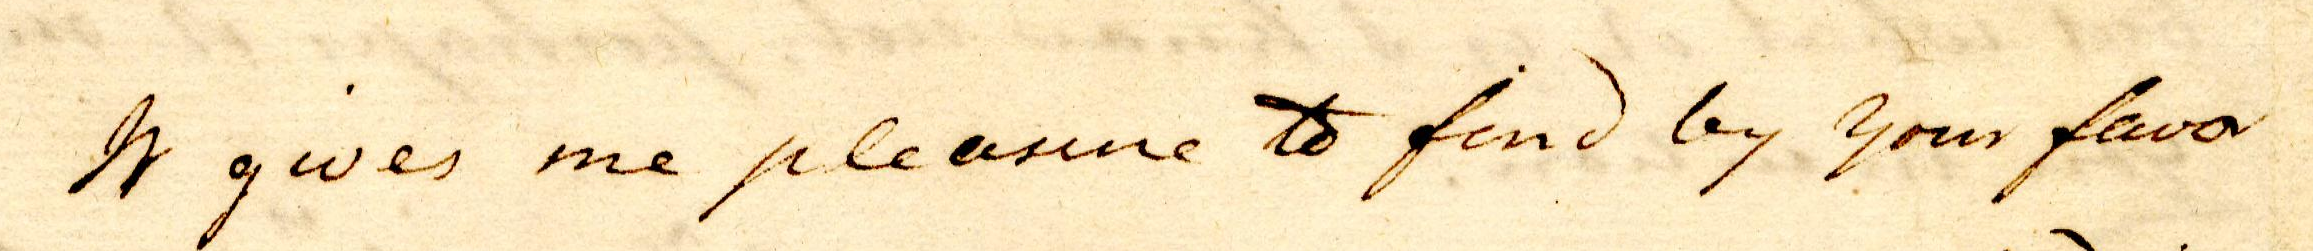It gives me pleasure to find by Your favor
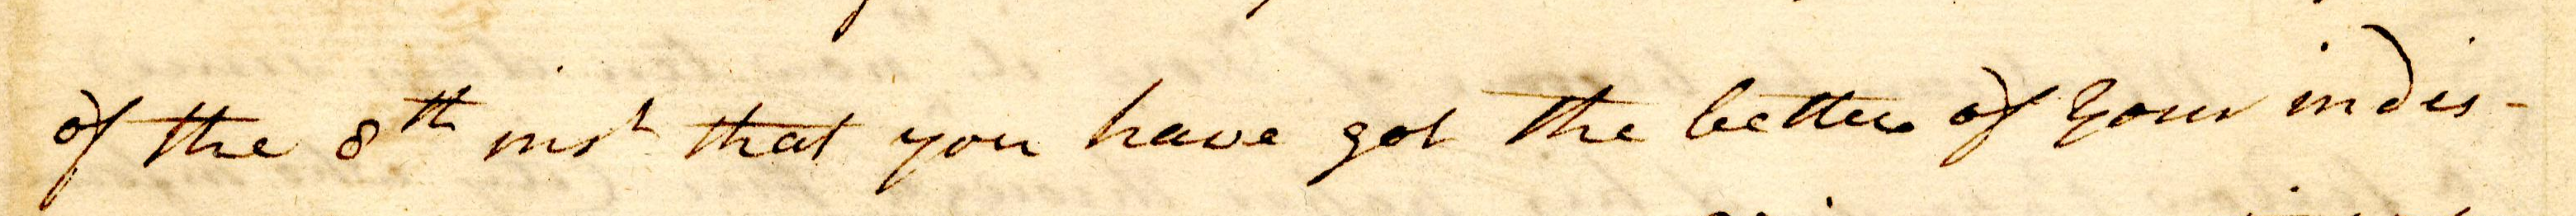of the 8^th. ins^t. that you have got the better of Your indis-
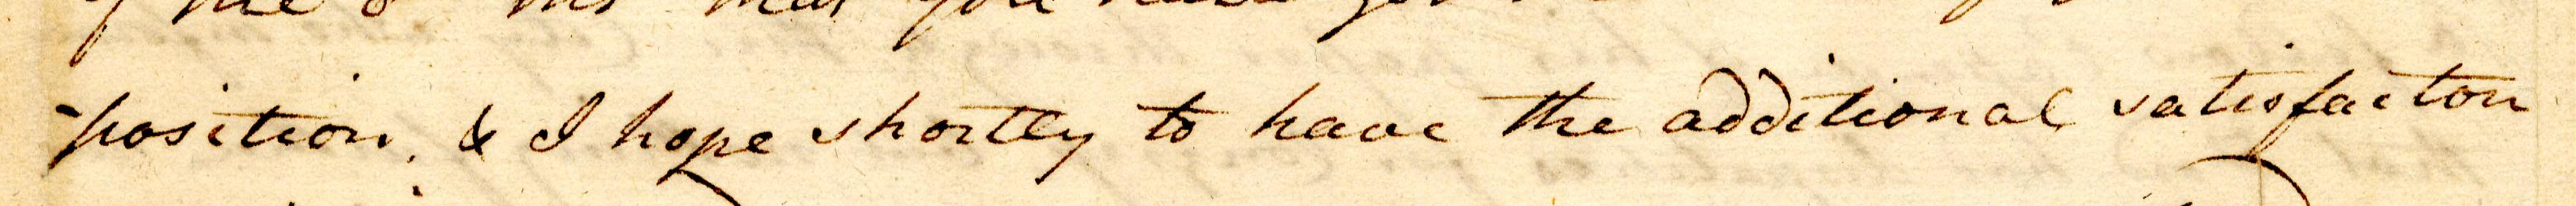-position, & I hope shortly to have the additional satisfaction
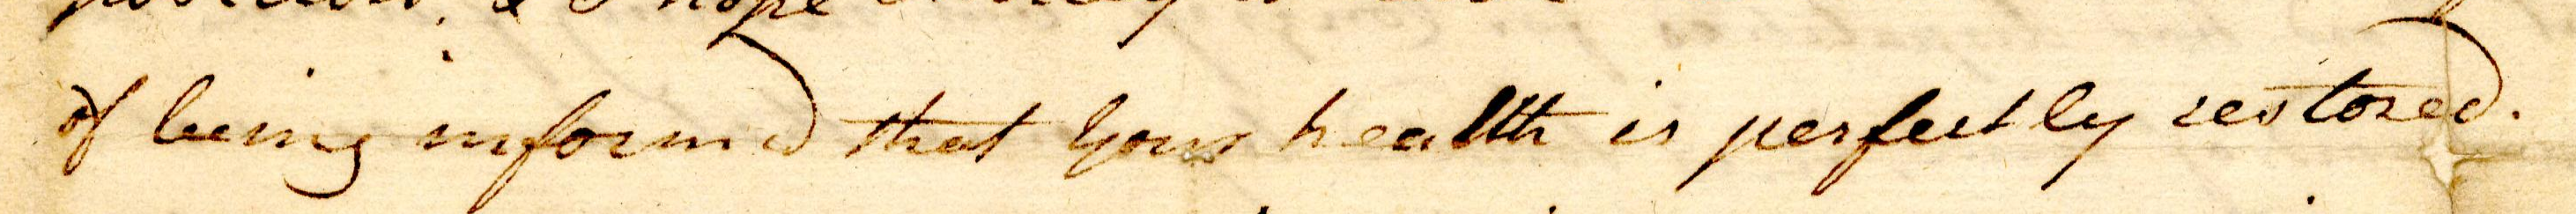of being informed that your health is perfectly restored.
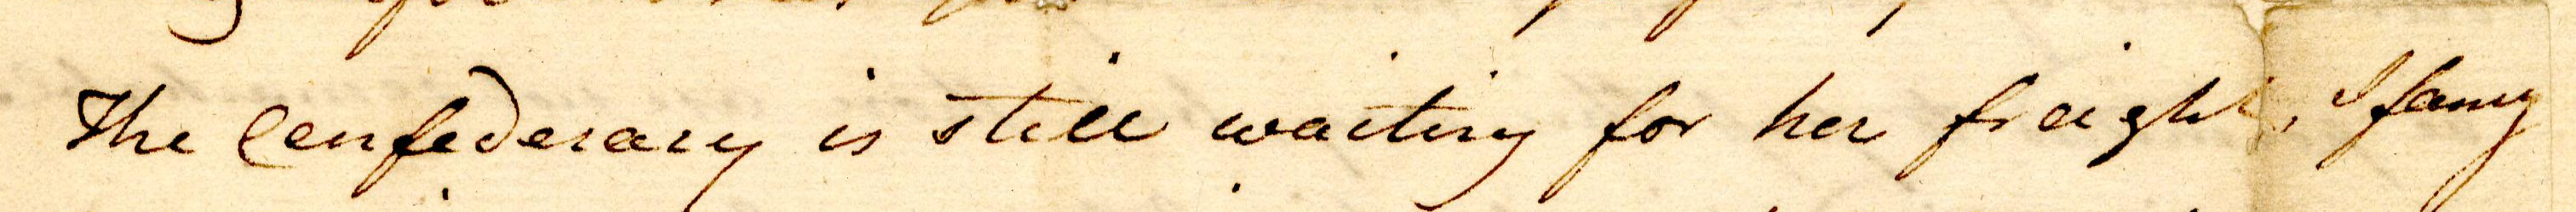The Confederacy is still waiting for her freight, I fancy
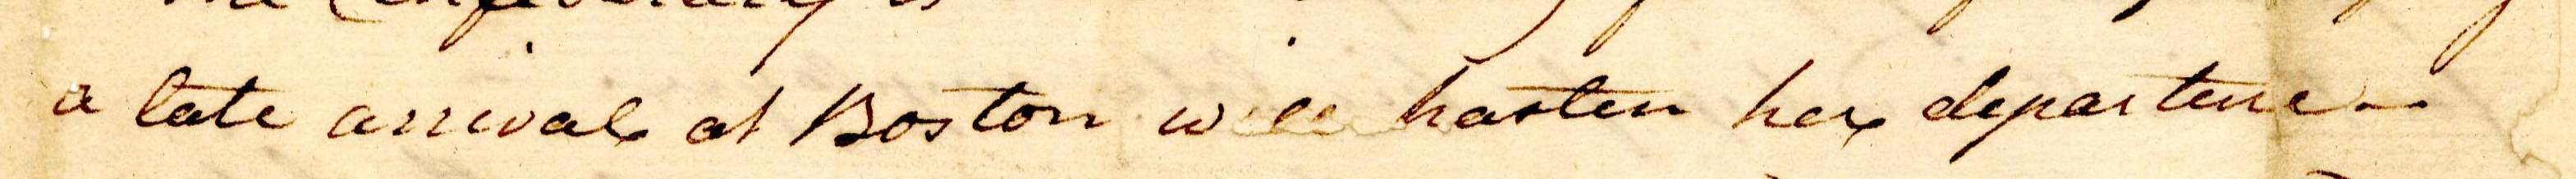a late arrival at Boston will hasten her departure.
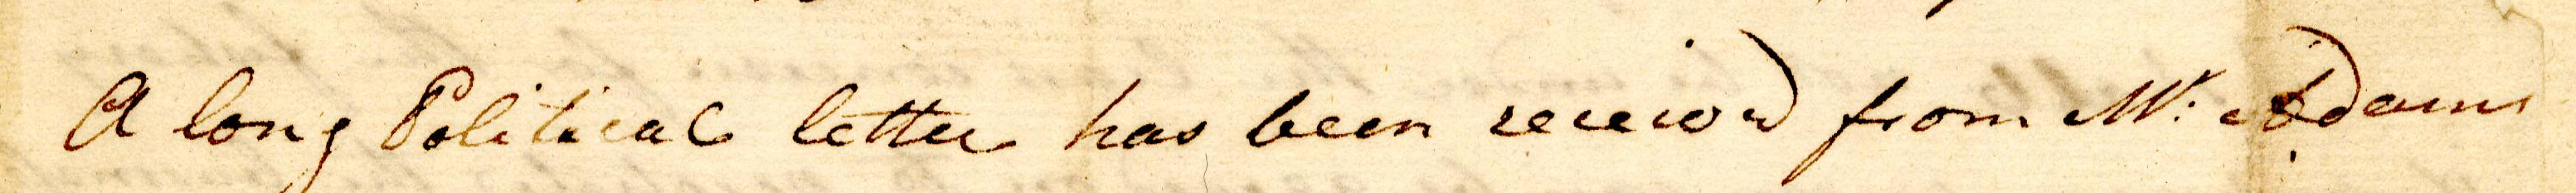A long Political letter has been received from M^r Adams
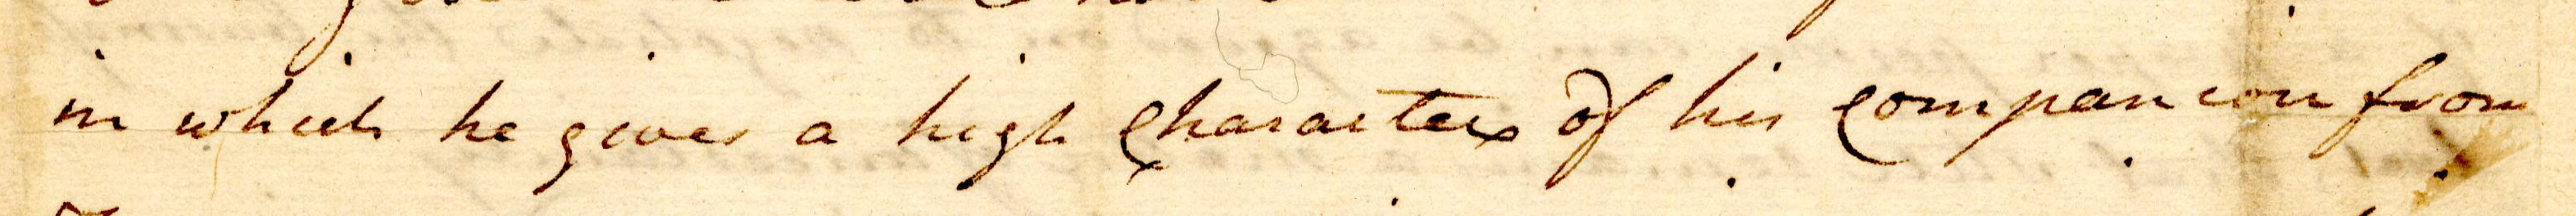in which he gives a high Character of his Companion for
